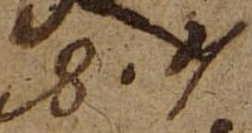4.8
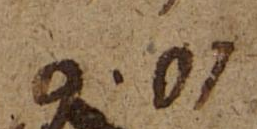10.6
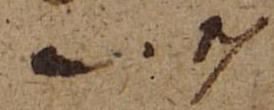4.-
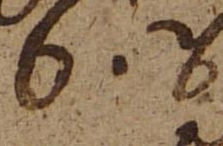2.9
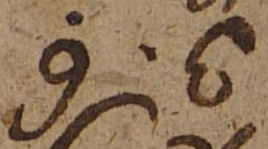3.6
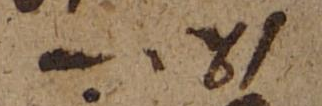12.-
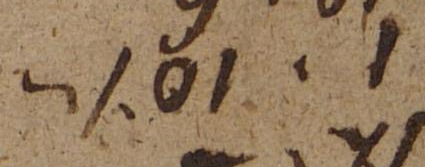1.10 1/2
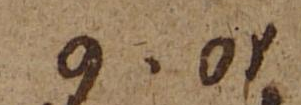10.6
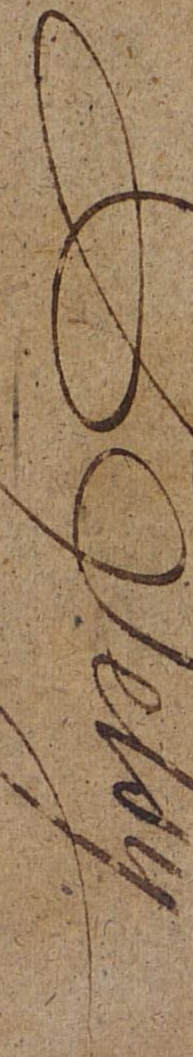Betsy
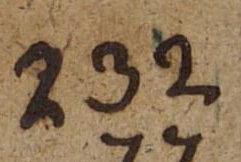2 2
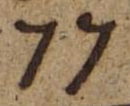77
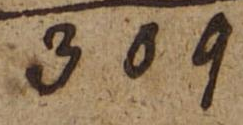3 0 9
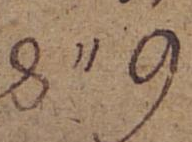6.8
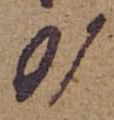10
